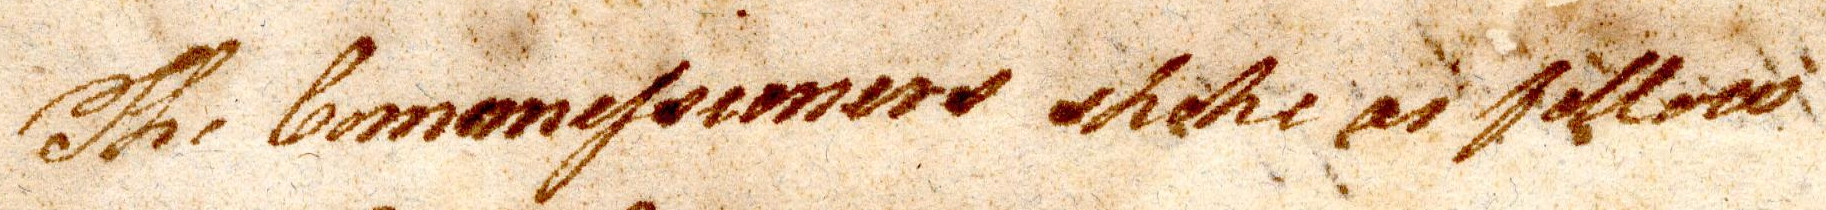The Commissioners spoke as follows
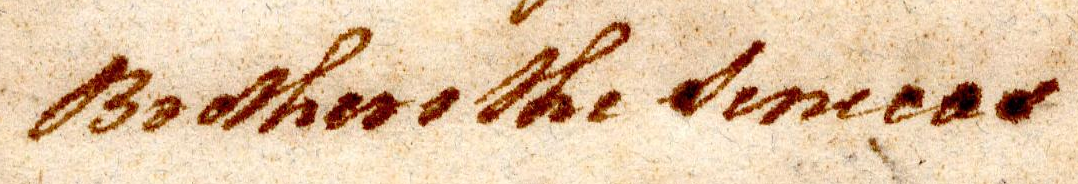Brothers the Senecas
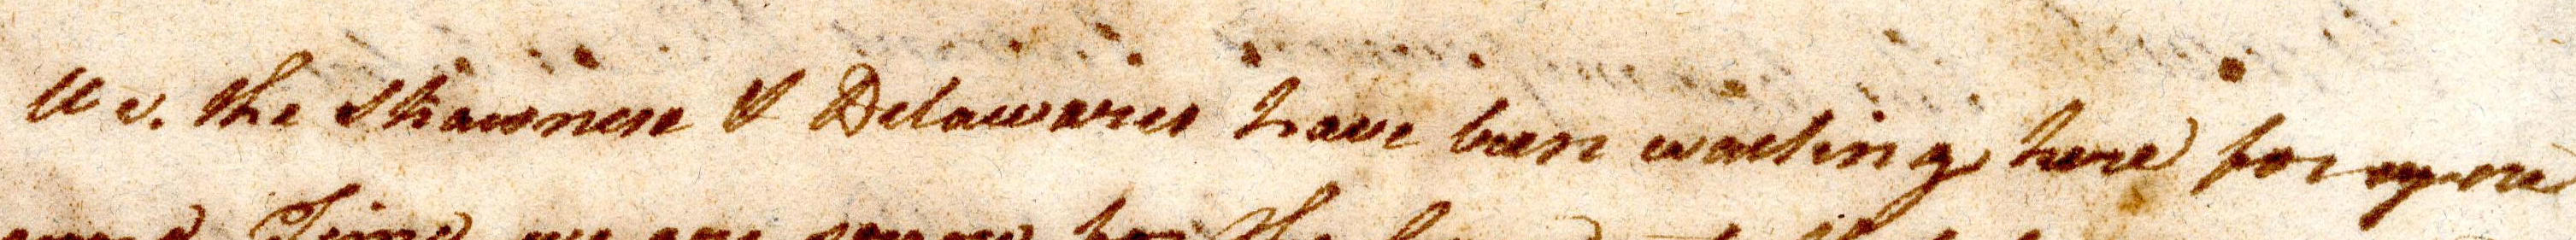we the Shawnese & Delawares have been waiting here for you
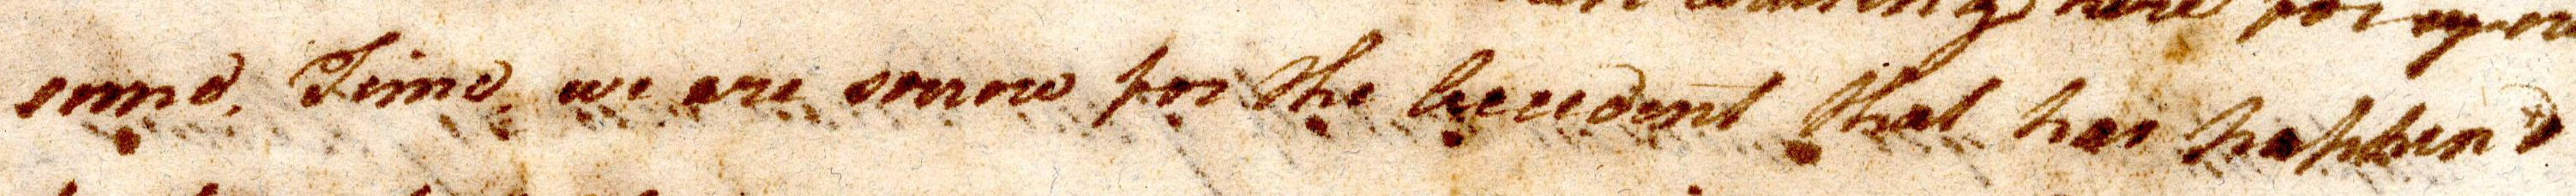some Time we are sorrow for the Incident that has happen'd
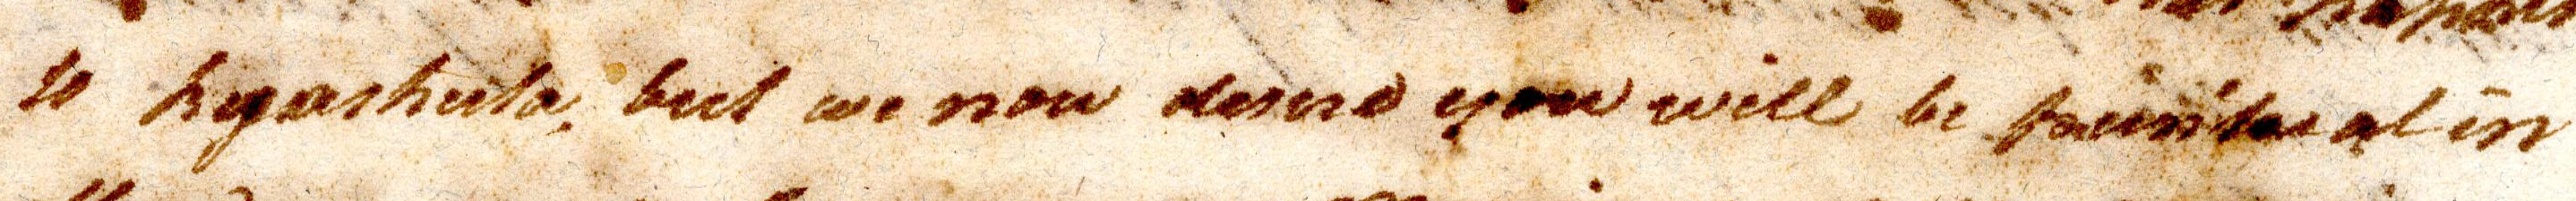to Gyashuta, but we now desire you will be punctual in
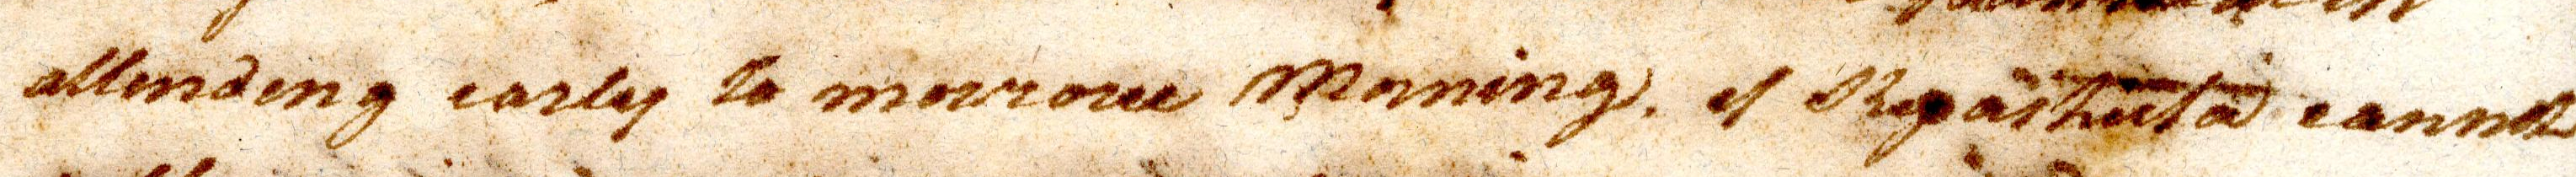attending early to morrow morning, if Ghyashuta cannot
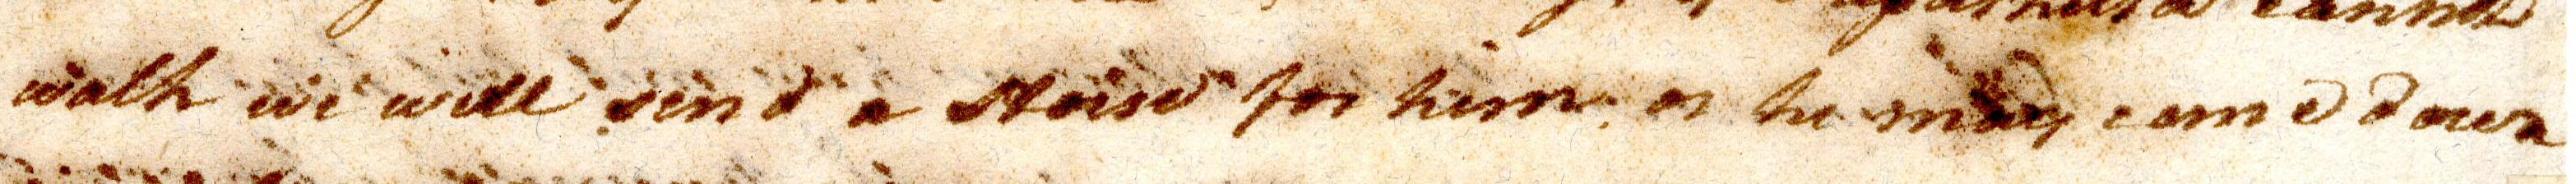walk we will send a Horse for him; or he may come down
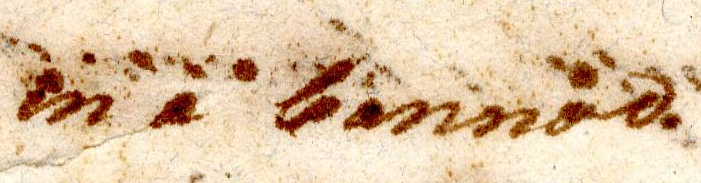in a Cannoe.
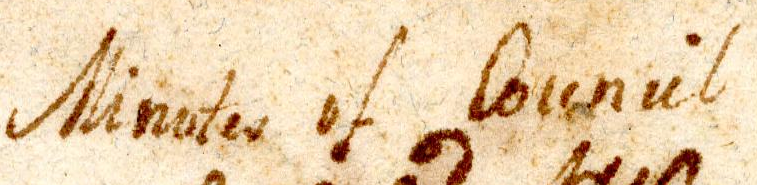Minutes of Council
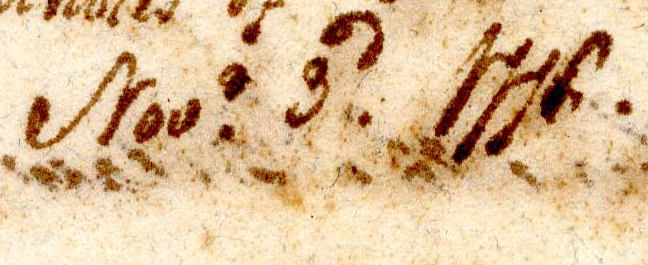Nov^r. 3^d. 1776
